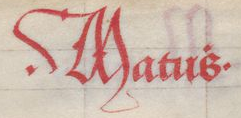.Matuṡ.
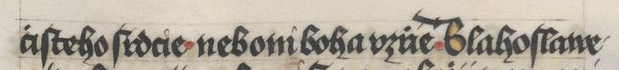ċiſteho ſrdcie.neb oni boha vzṙíe.Blahoſlawe¬
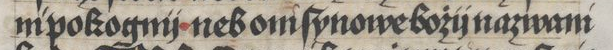ni pokognij.neb oni ſynowe bożij nazwaní
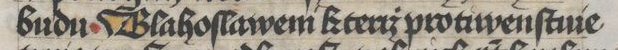budu.Blahoſlawení kteriż protiwenſtuíe
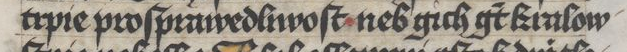trpie proſprawedliwoſt.neb gich ḡt kralow¬
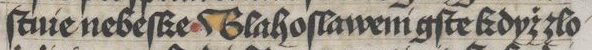ſtuíe nebeſke.Blahoſlawení gſte kdyż zlo¬
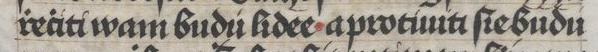ṙeċiti wam budú lidee.a protiuiti ſie budu
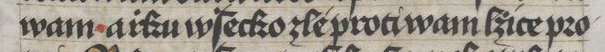wam.a ṙku wẛecko zlé proti wám lżíce pro¬
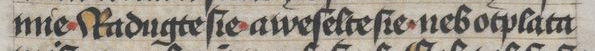mie.Radugte ſie.aweſelte ſie.neb otplata
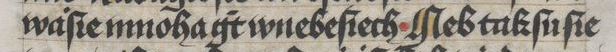waẛte mnoha ḡt wnebeſiech.Neb takſu ſie
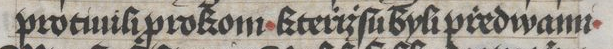protiuili prokom.kteṙiż ſu byli před wami.
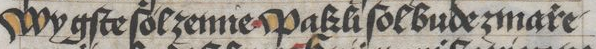Wy gſte ſól zemie.Pakli ſol bude zmaṙe¬
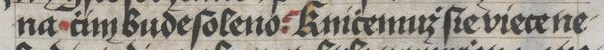na.ċim bude ſoleno?Kniċemuż ſie víece ne¬
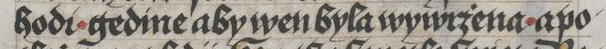hodí.gedine aby wen byla wywrżena.apo¬
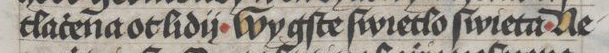tlaċena ot lidij.Wy gſte ſwietlo ſwieta.Ne¬
